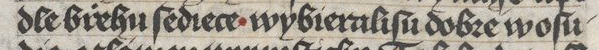dle bṙehu ſedíece.wybierali ſu dobré w oſu¬
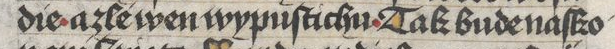die.a zlé wen wypuſtichu.Tak bude naſko¬
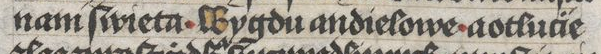naní ſwieta.Wygdu andielowe.a otluċíe
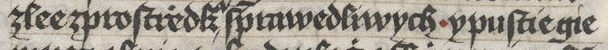zlee zproſtṙedka ſprawedliwych.y puſtie gie¬
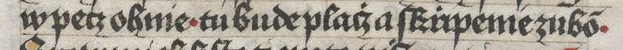w pecz ohnie.tu bude placż a ſkṙipenie zubō.
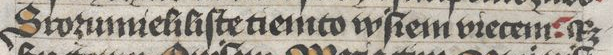Srozumielili ſte tiemto wẛiem viecem?Rz¬
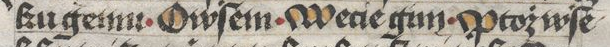ku gemu.Owẛem.Wecie gim.Ꝓtoż wẛe¬
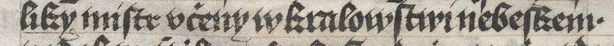liky míſtr vċeny w kralowſtwí nebeſkem.
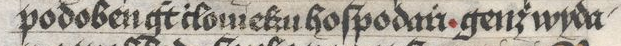podoben ḡt ċlouieku hoſpodaṙi.genż wyda¬
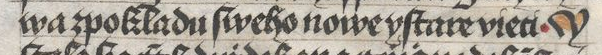wa zpokladu ſweho nowe yſtare vieci.Y
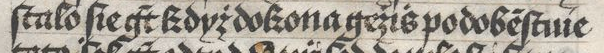ſtalo ſie ḡt když dokona geżíš podobēſtuíe
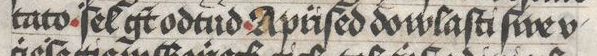tato ẛel ḡt odtud.A pṙiẛed dowlaſti ſwe v¬
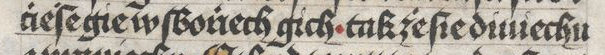ċieẛe gie w ſboṙiech gich.tak że ſie diuiechu
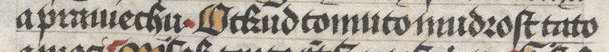a prauíechu.Otkud tomuto mudroſt tato
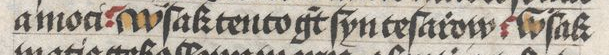a moci?Wẛak tento ḡt ſyn teſaṙow?Wẛak
